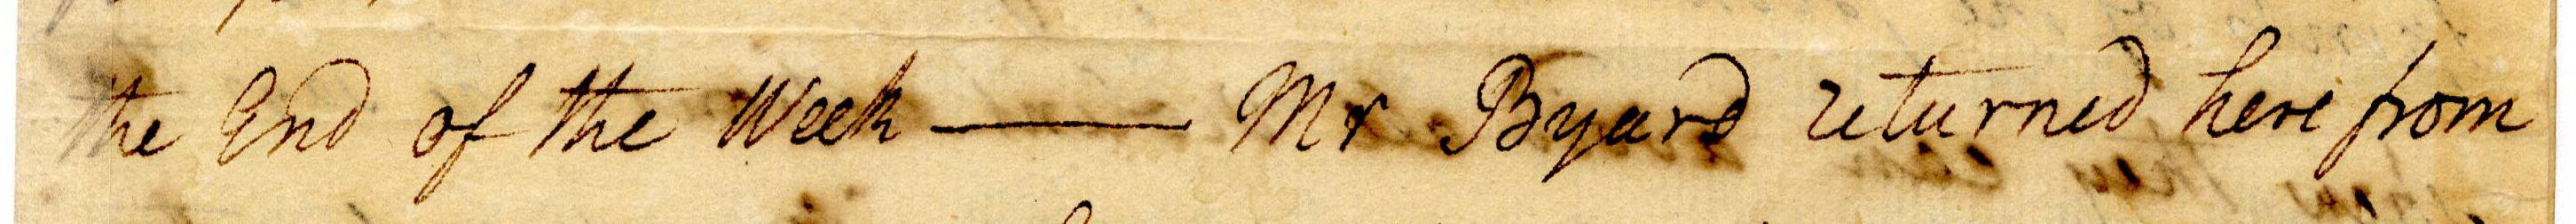the End of the Week- Mr Byard returned here from
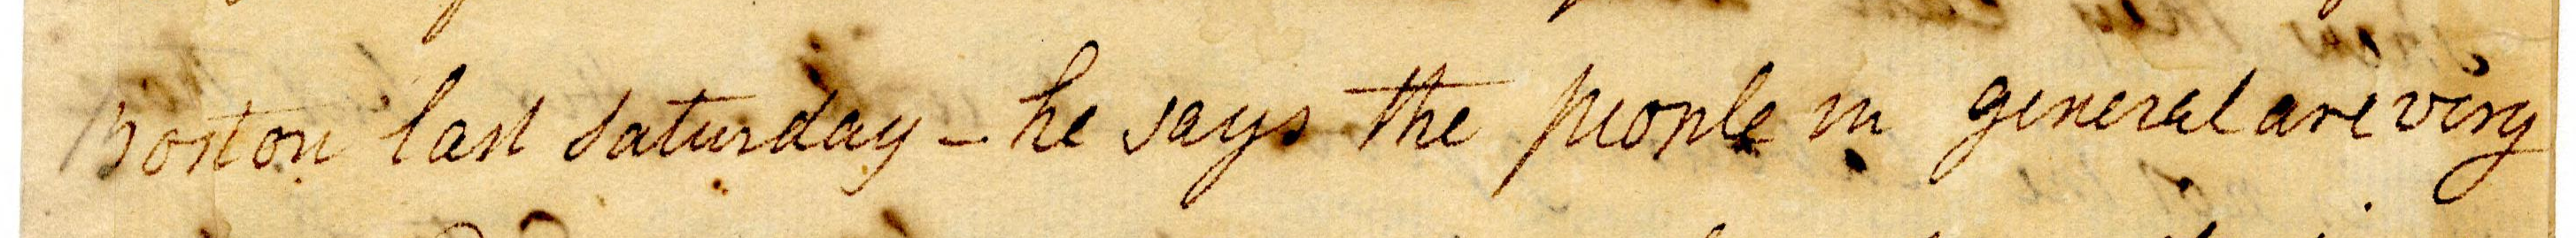Boston last saturday- he says the people in general are very
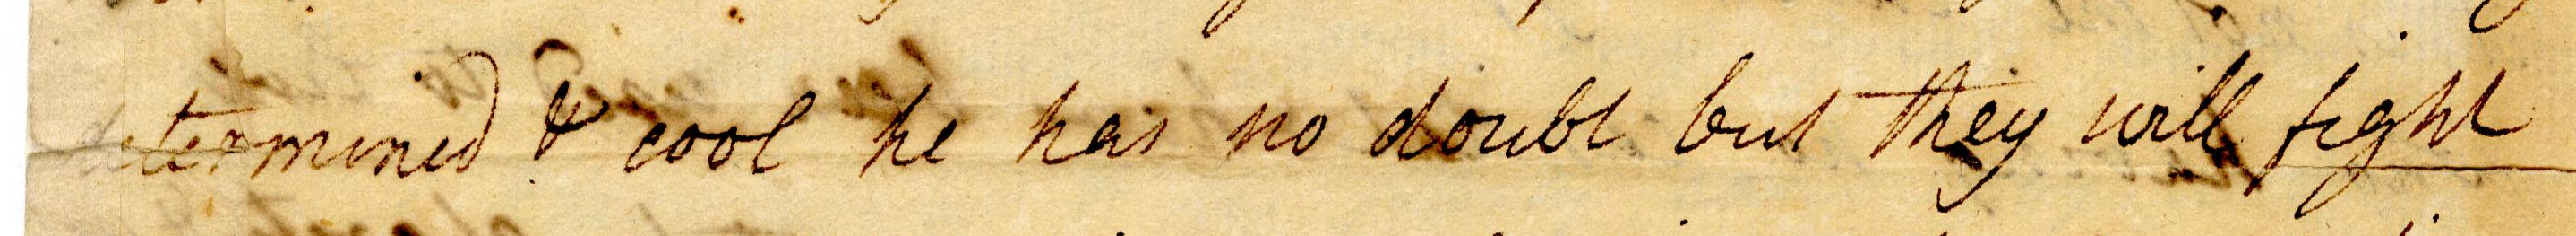determined & cool he has no doubt but they will fight
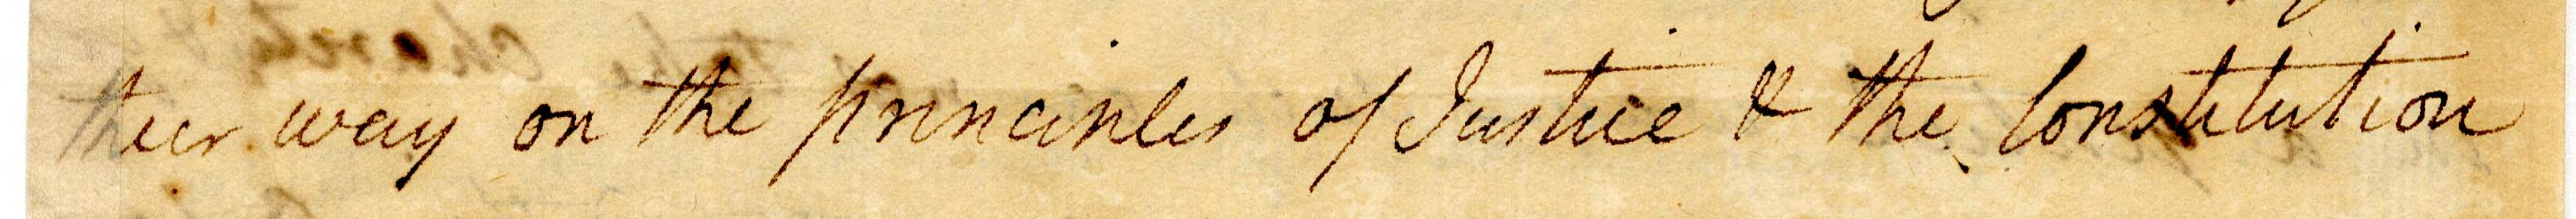their way on the principles of Justice & the Constitution
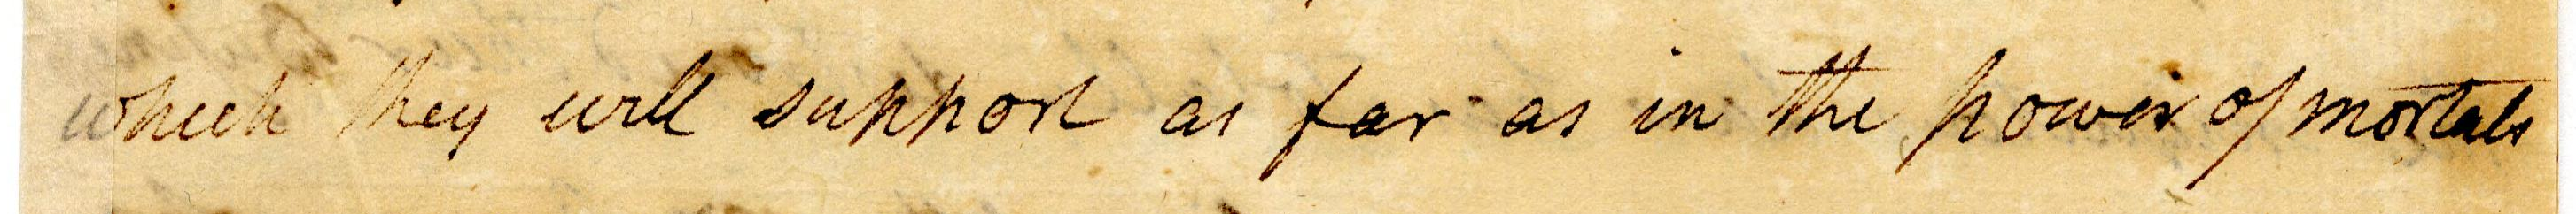which they will support as far as in the power of mortals
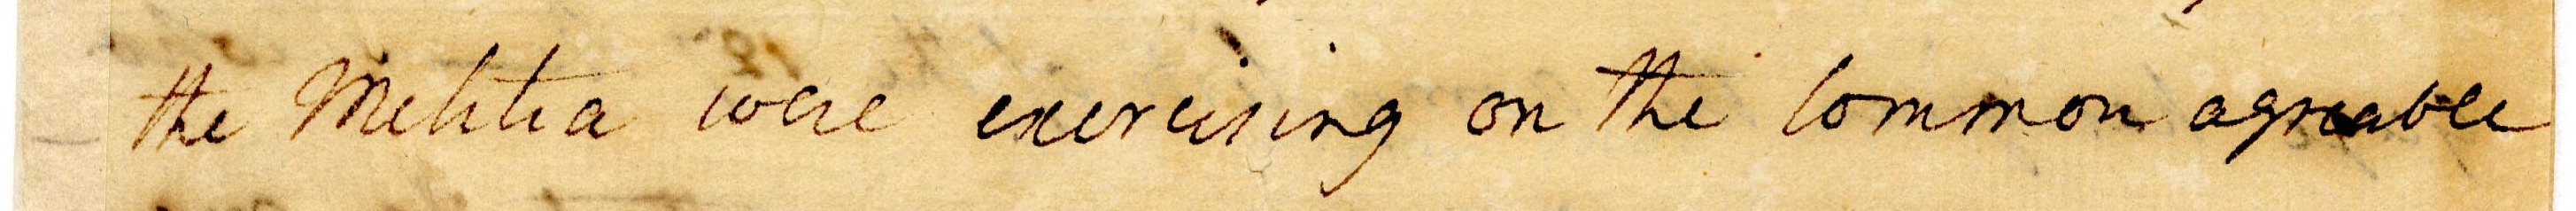-the Militia were exercising on the Common agreable
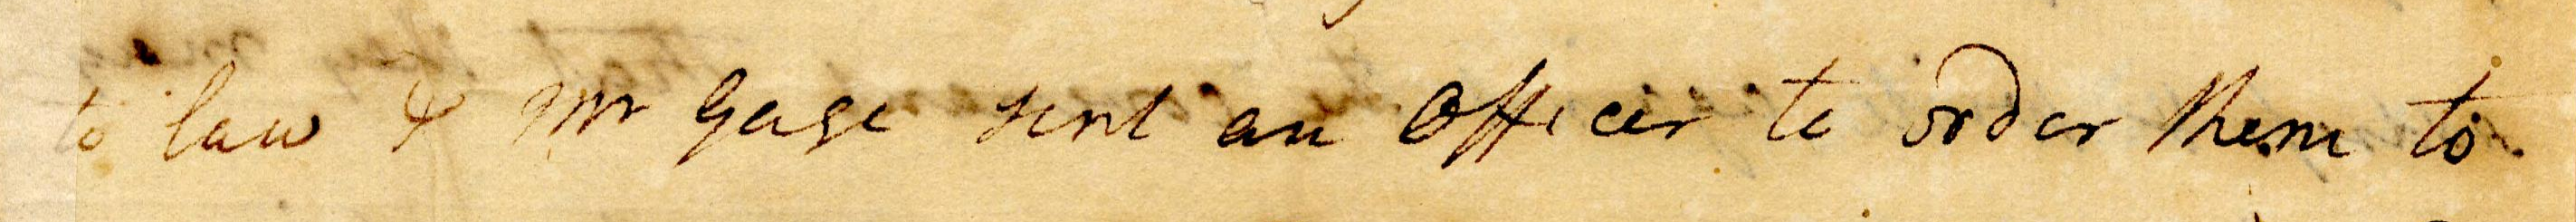to law & M^r Gage sent an officer to order them to
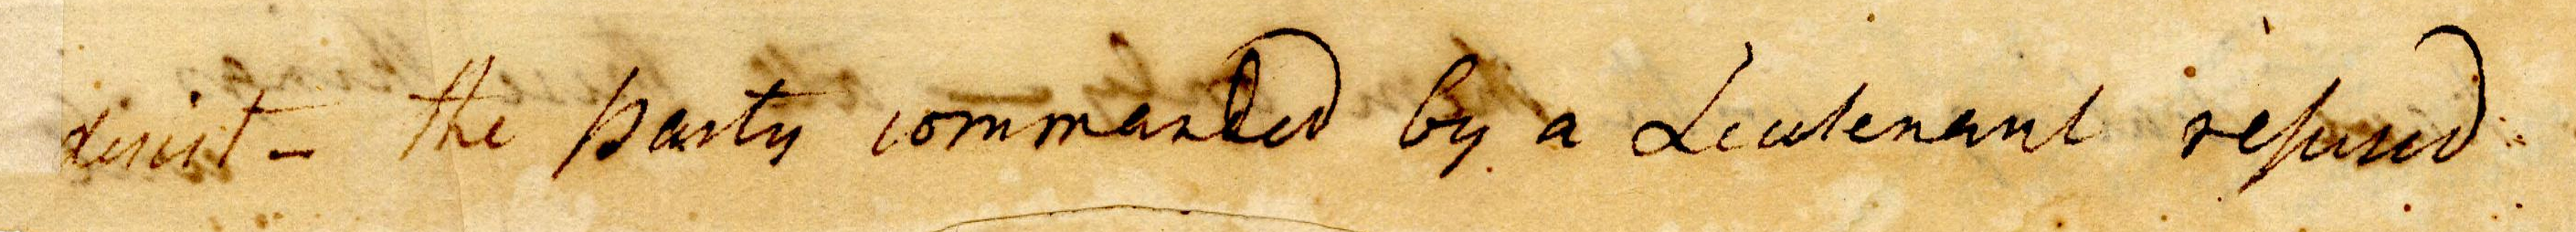desist- The party commanded by a Leutenant refused
